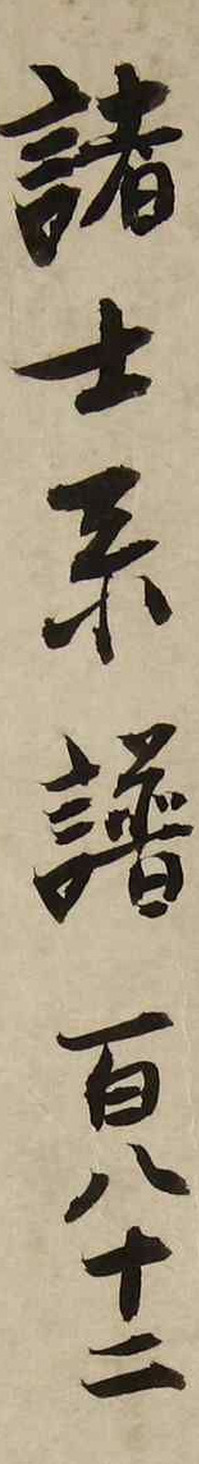諸士系譜百八十二

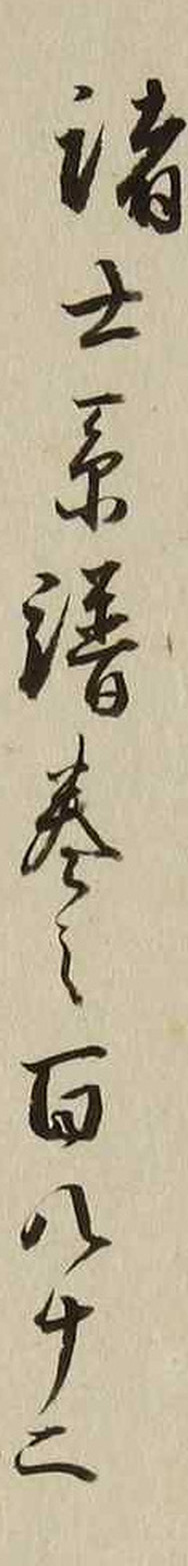諸士系譜巻之百八十二
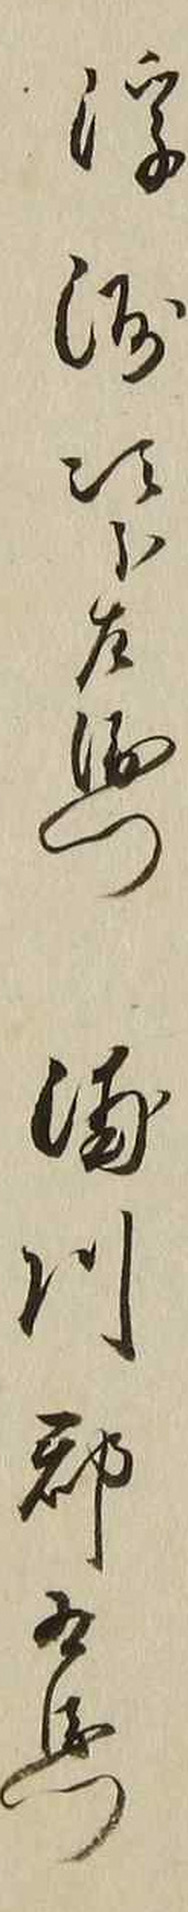浮洲次郎左衛門浦川郡右衛門
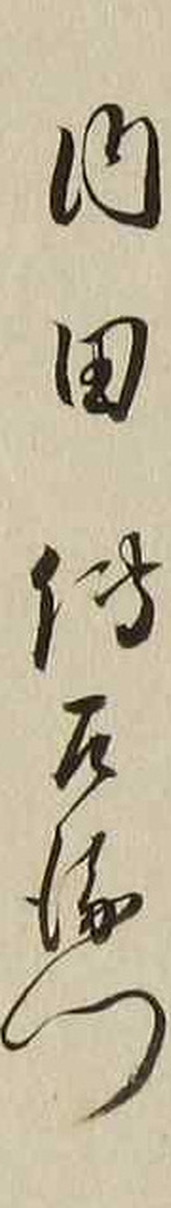内田伝左衛門
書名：諸士系譜　巻之182　う之部1
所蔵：会津若松市立会津図書館
